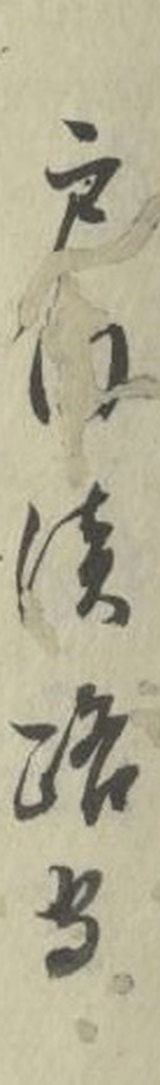同断戸田淡路守
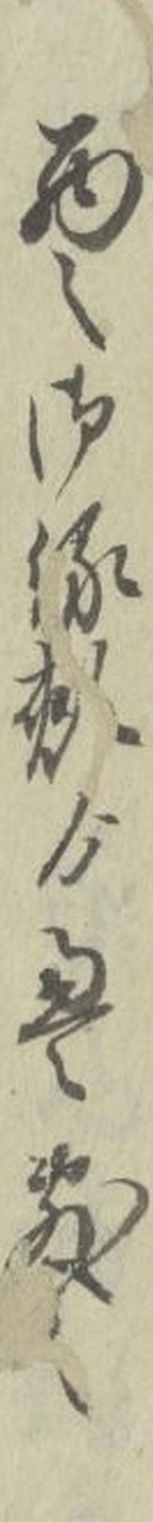西丸御縁頬ゟ畳敷之
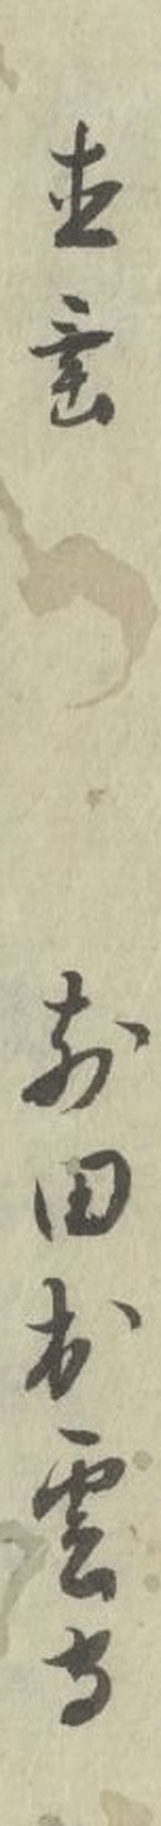直垂前田出雲守
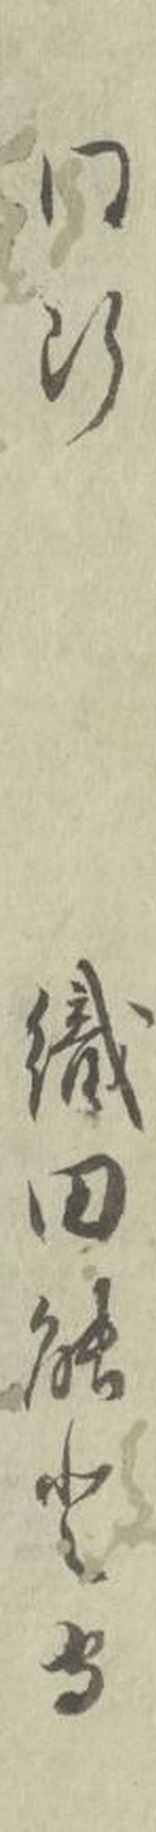同断織田能登守
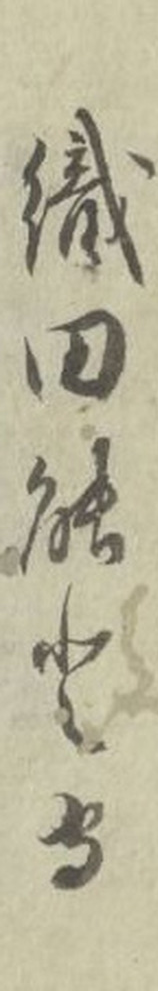同断織田能登守
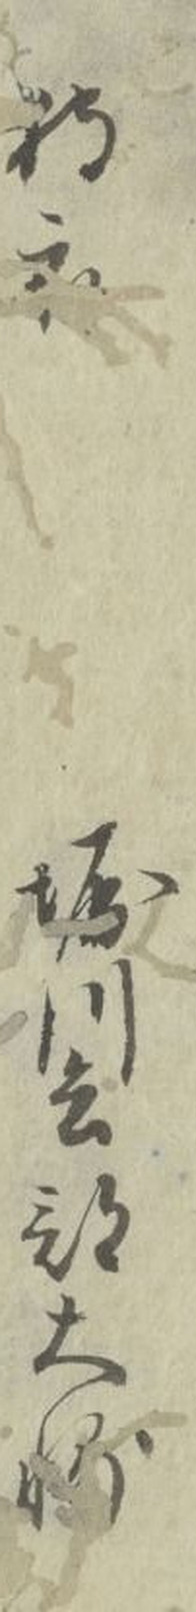狩衣堀川兵部大輔

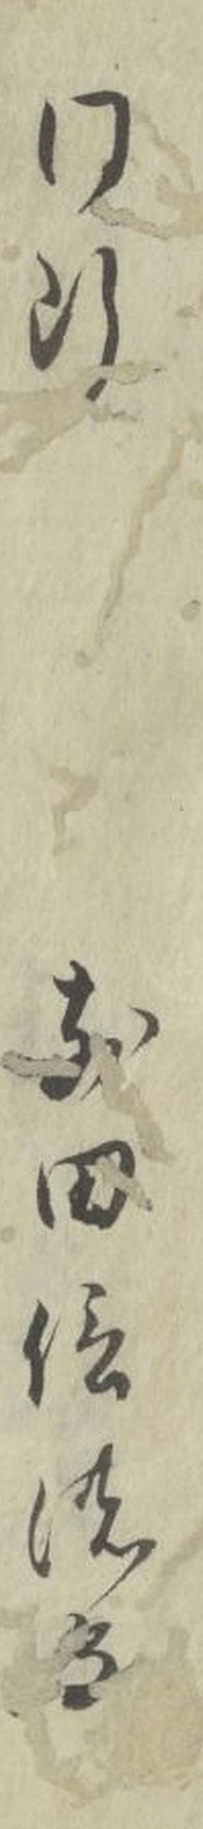同断前田信濃守
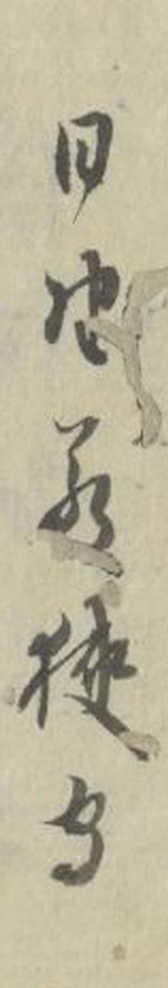同断日野若狭守
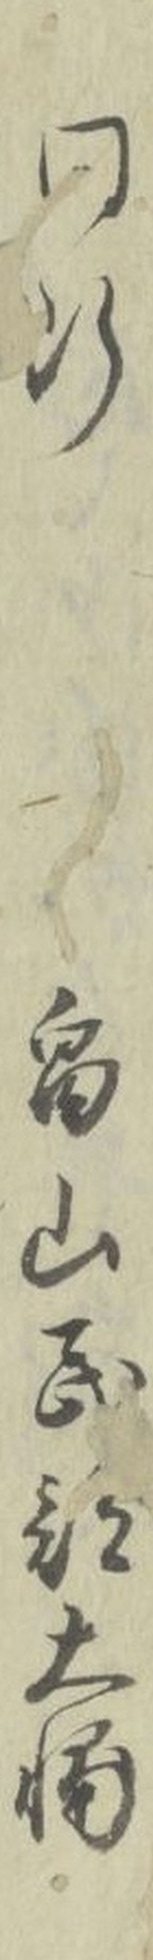同断畠山民部大輔
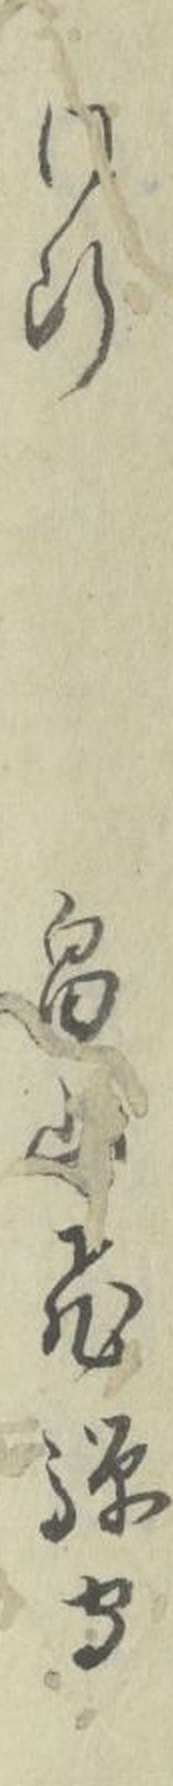同断畠山飛騨守
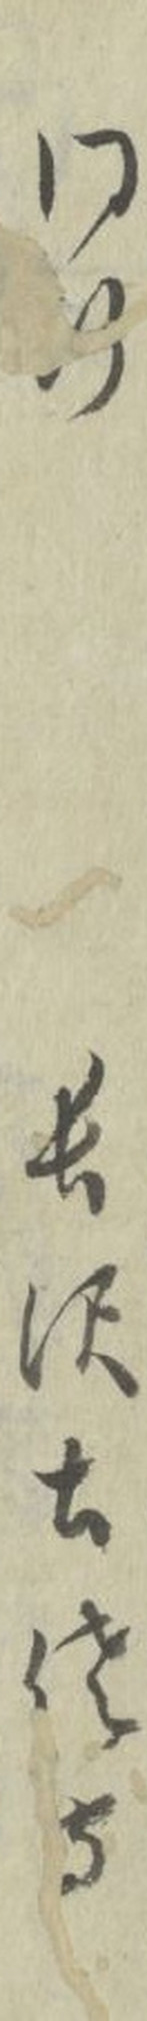同断長澤土佐守
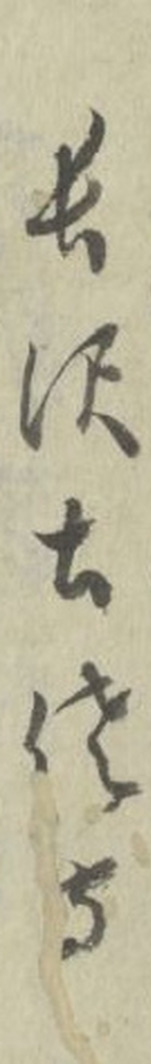同断長澤土佐守
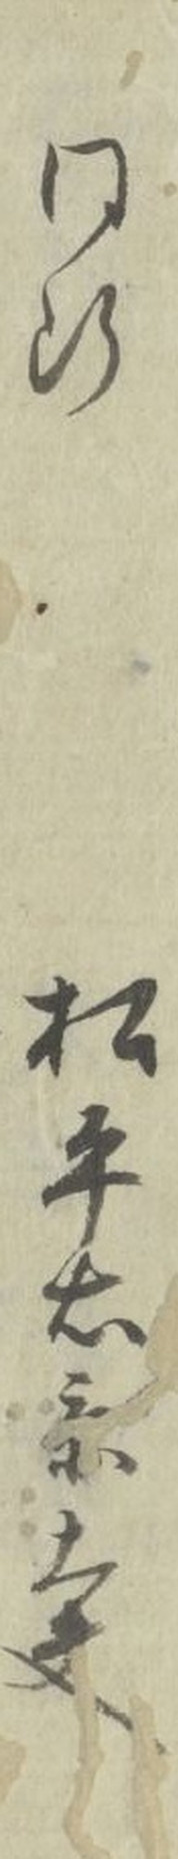同断松平右兵衛大夫
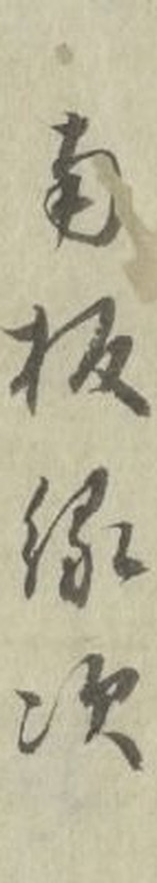南板縁次
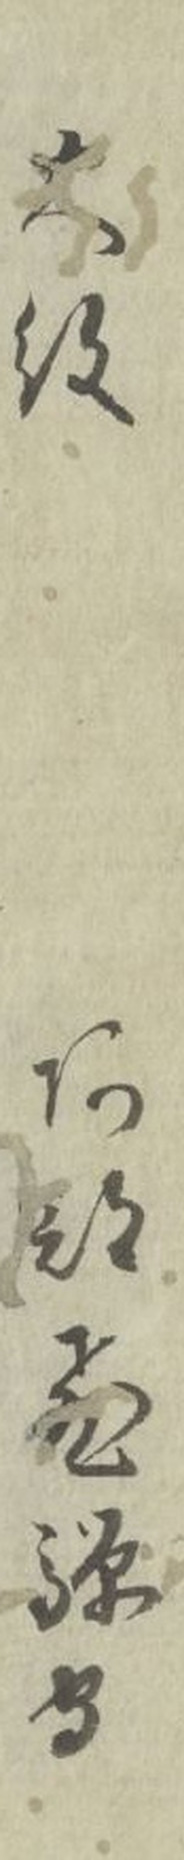大紋阿部飛騨守
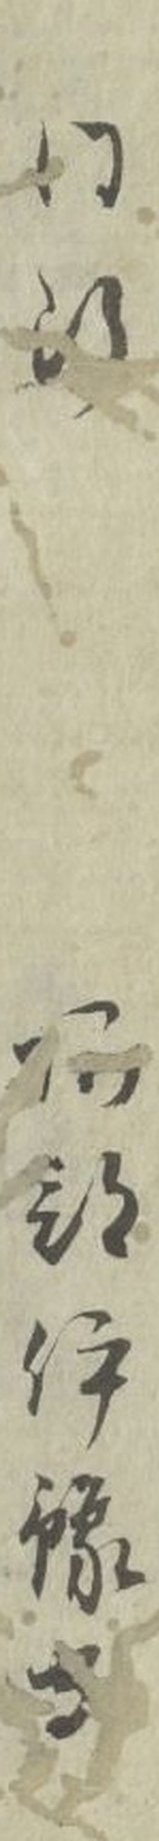同断阿部伊予守
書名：琉球来朝記 自一至七
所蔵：University of the Ryukyus Library
